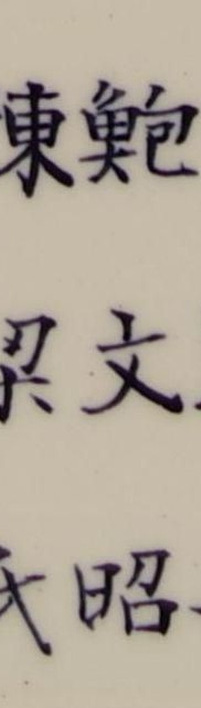鮑文昭
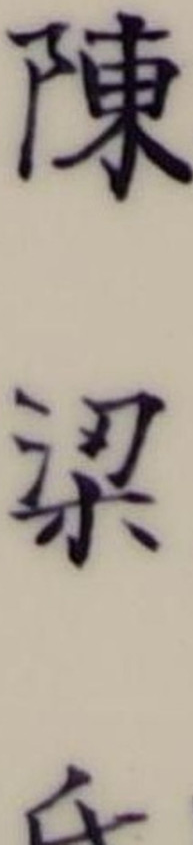陳梁氏
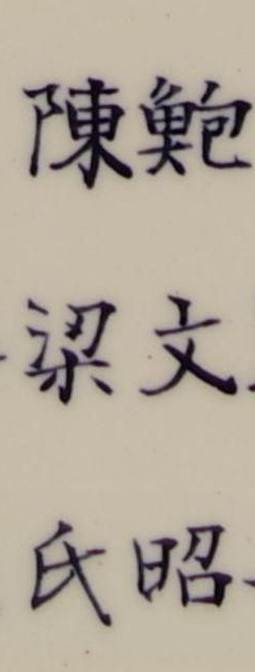陳梁氏
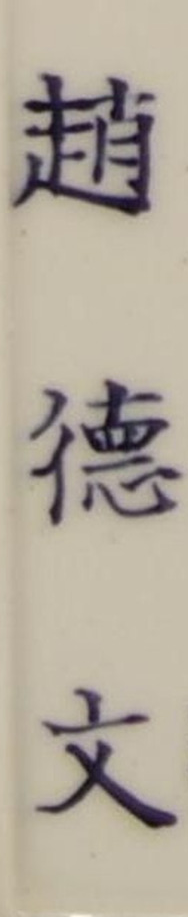趙徳文

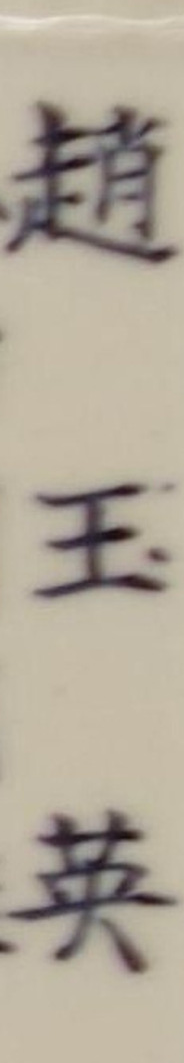趙玉英
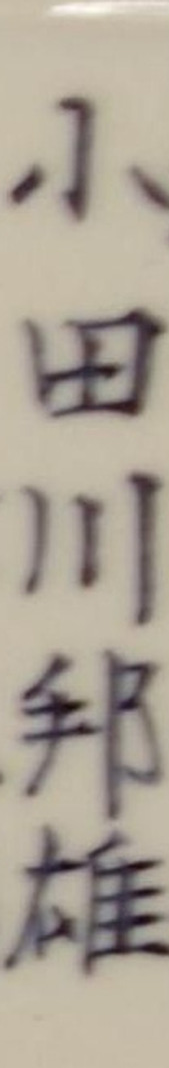小田川邦雄
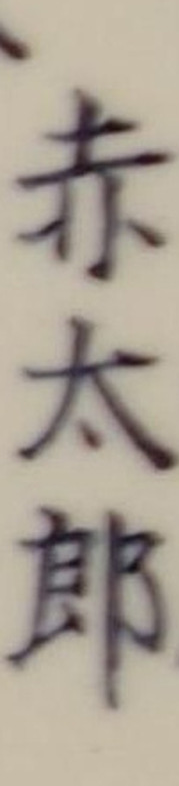赤太郎
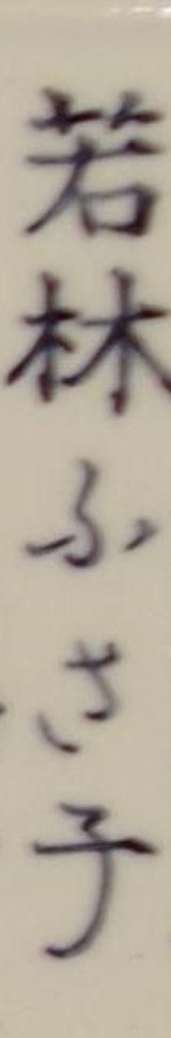若林ふさ子
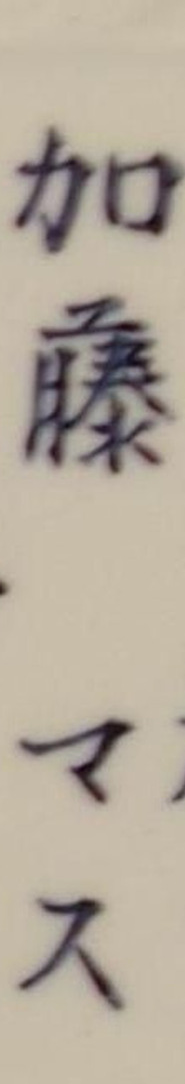加藤マス
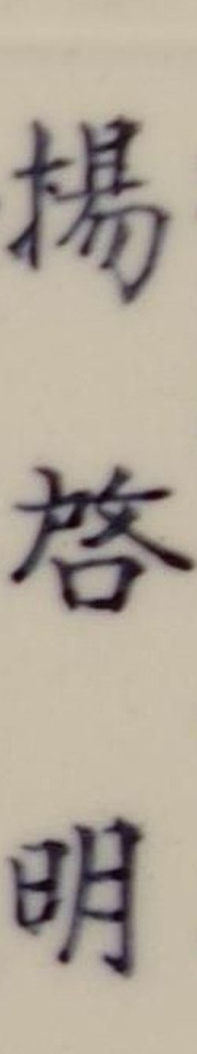楊啓明
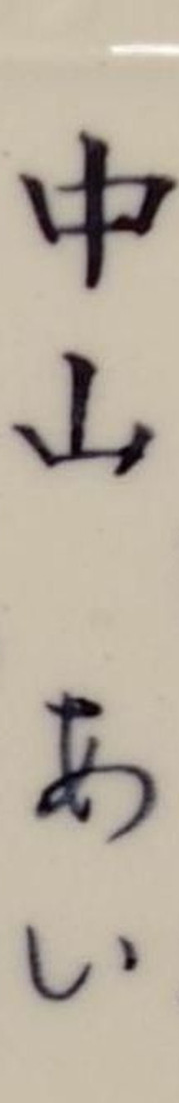中山あい
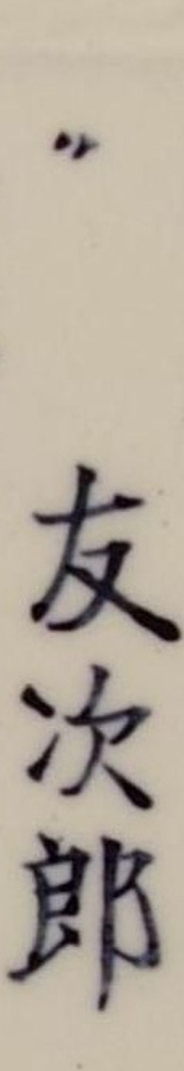友次郎
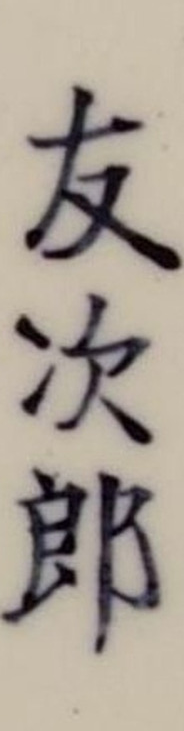友次郎
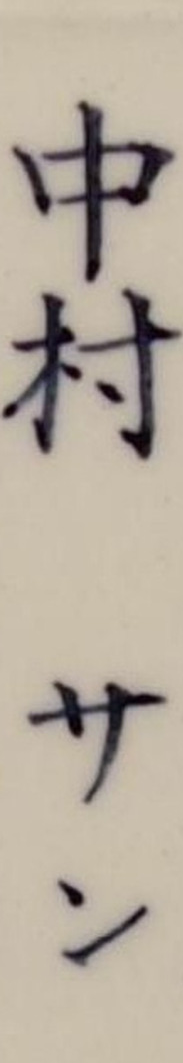中村サン
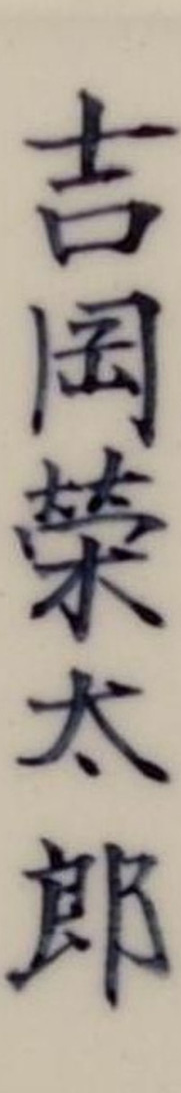吉岡榮太郎
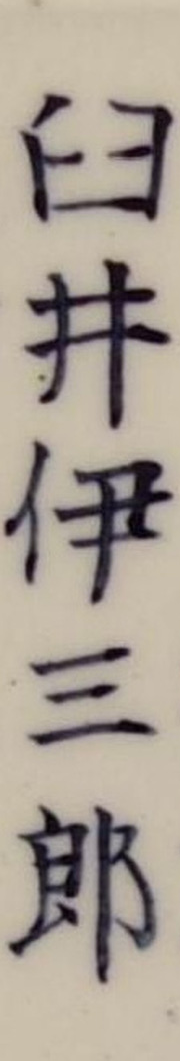臼井伊三郎
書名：M~S
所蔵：高野山金剛峯寺
